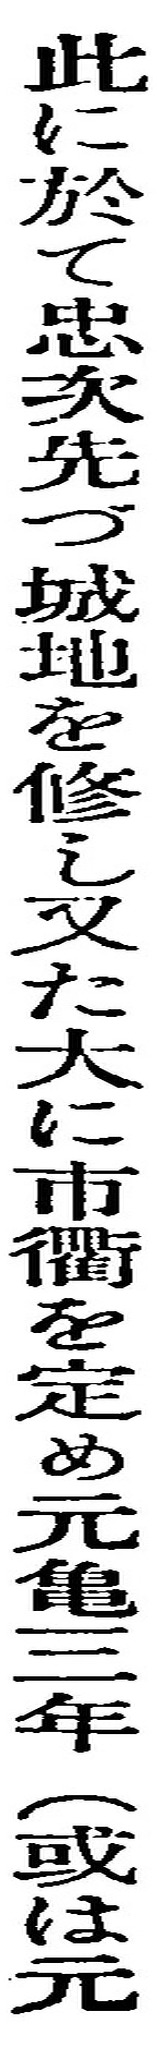此に於て忠次先づ城地を修し又た大に市衢を定め元亀三年(或は元
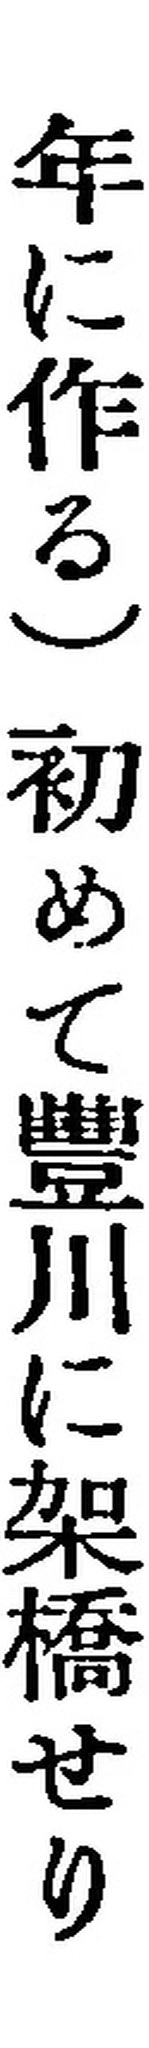年に作る)初めて豐川に架橋せり
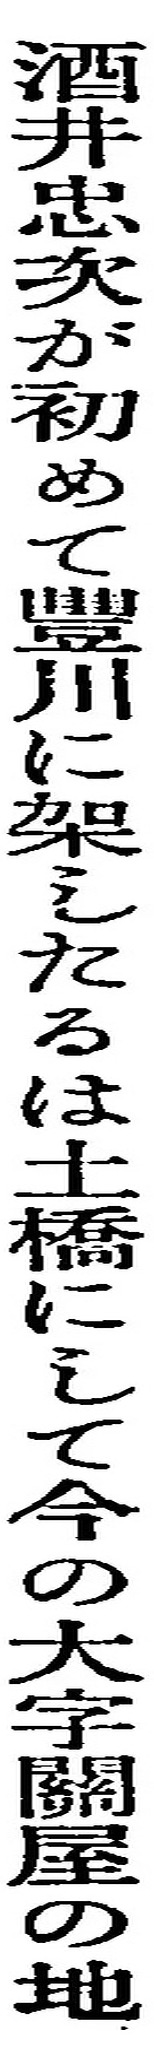酒井忠次が初めて豐川に架したるは土橋にして今の大字關屋の地

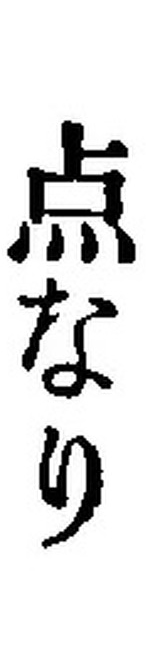点なり
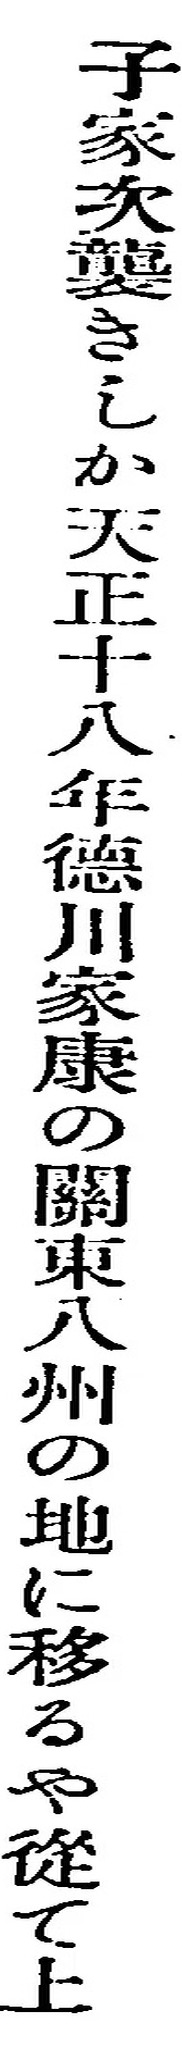子家次襲きしか天正十八年德川家康の關東八州の地に移るや從て上
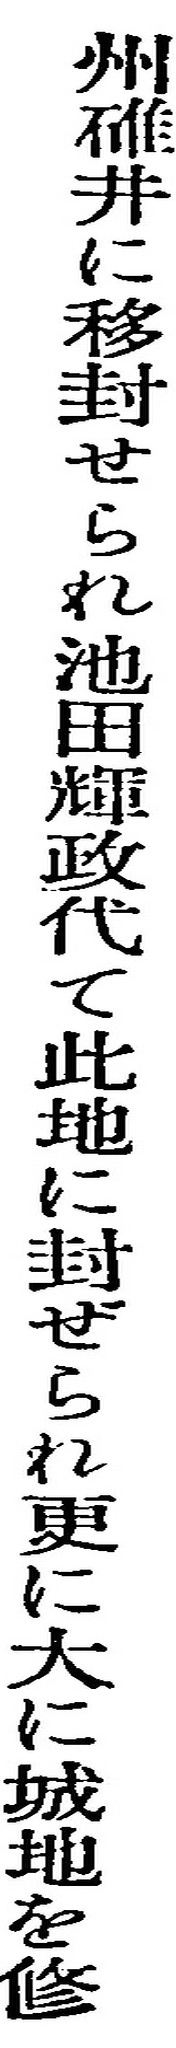州碓井に移封せられ池田輝政代て此地に封ぜられ更に大に城地を修
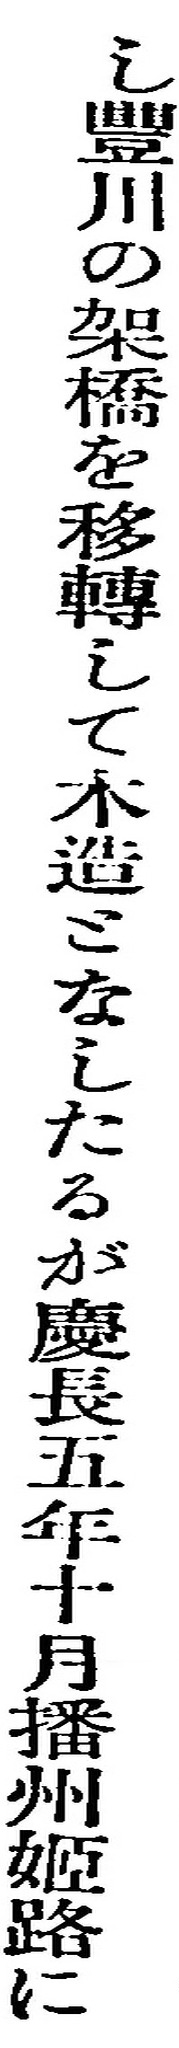し豐川の架橋を移轉して木造となしたるが慶長五年十月播州姫路に
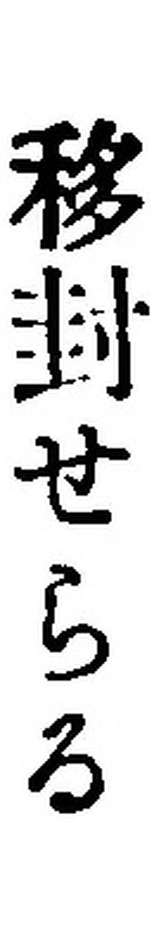移封せらる
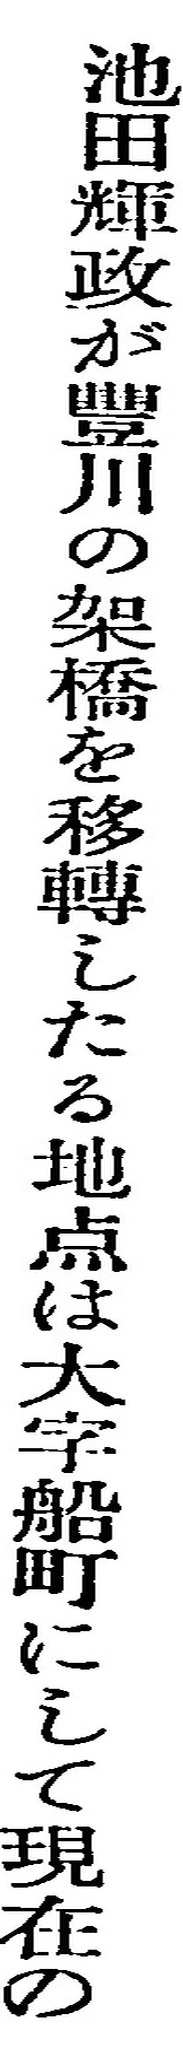池田輝政が豐川の架橋を移轉したる地点は大字船町にして現在の
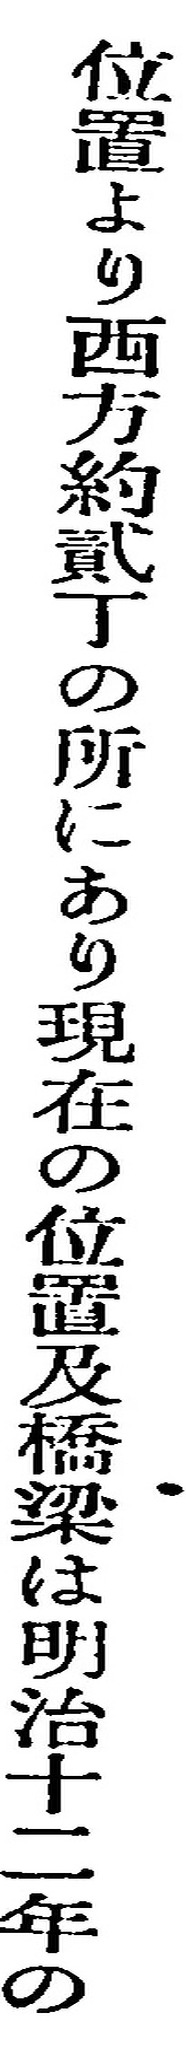位置より西方約貳丁の所にあり現在の位置及橋梁は明治十二年の
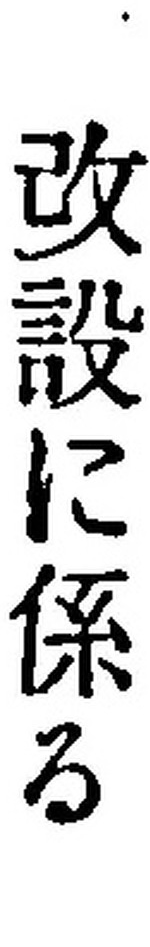改設に係る
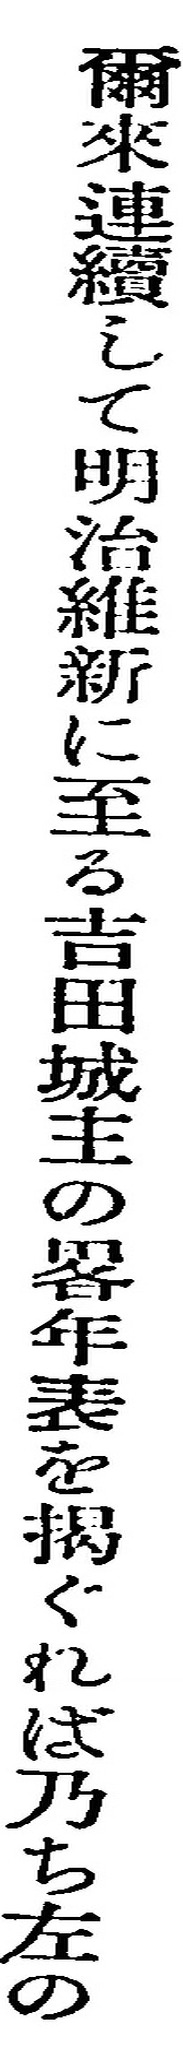爾來連續して明治維新に至る吉田城主の畧年表を揭ぐれば乃ち左の
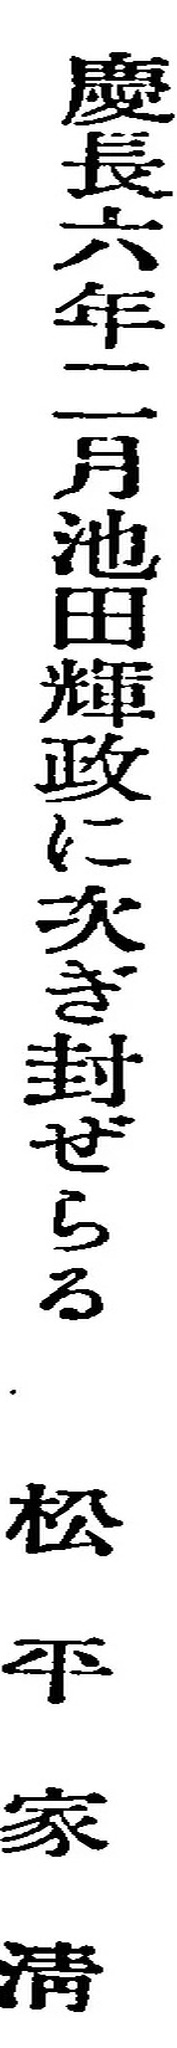慶長六年二月池田輝政に次ぎ封ぜらる松平家淸
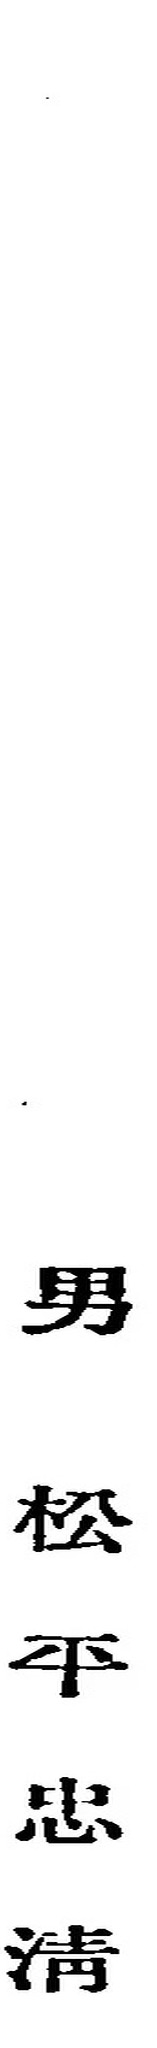男松平忠淸
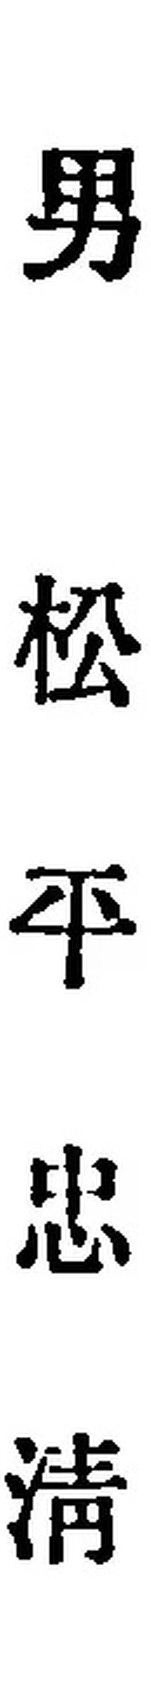男松平忠淸
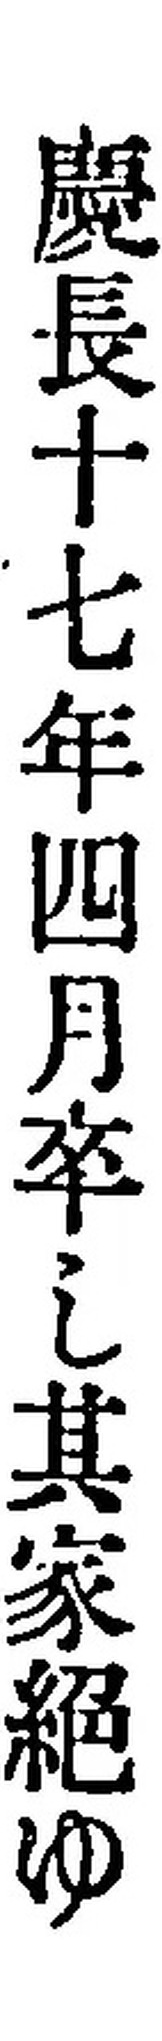慶長十七年四月卒し其家絕ゆ
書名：豊橋志要
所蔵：国立国会図書館 National Diet Library, JAPAN
